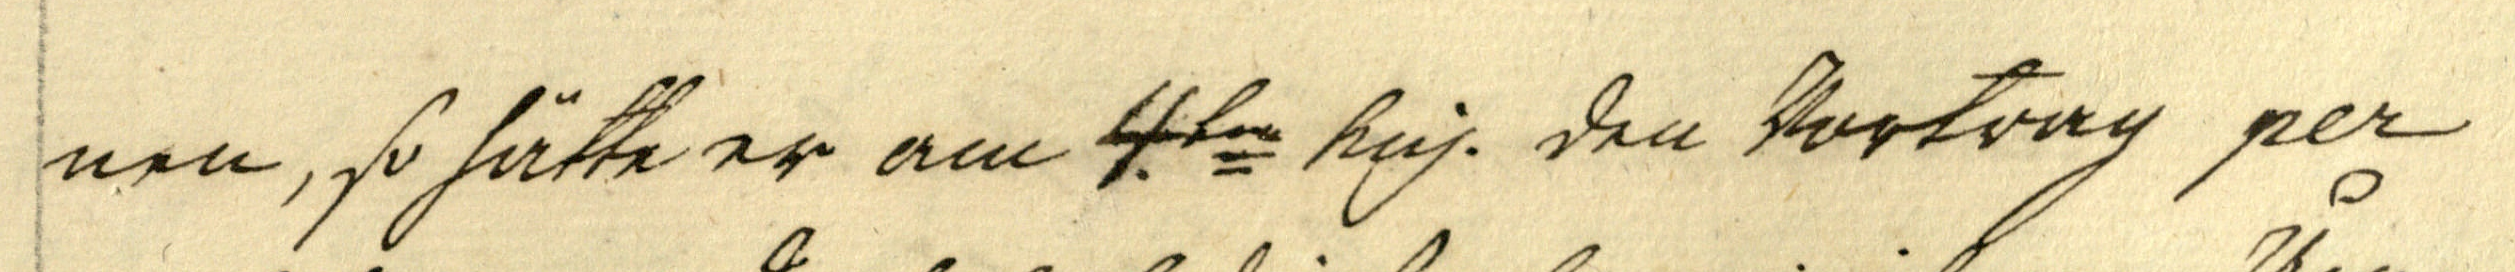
nen, so hätte er am 4. ten huj. den Vortrag per
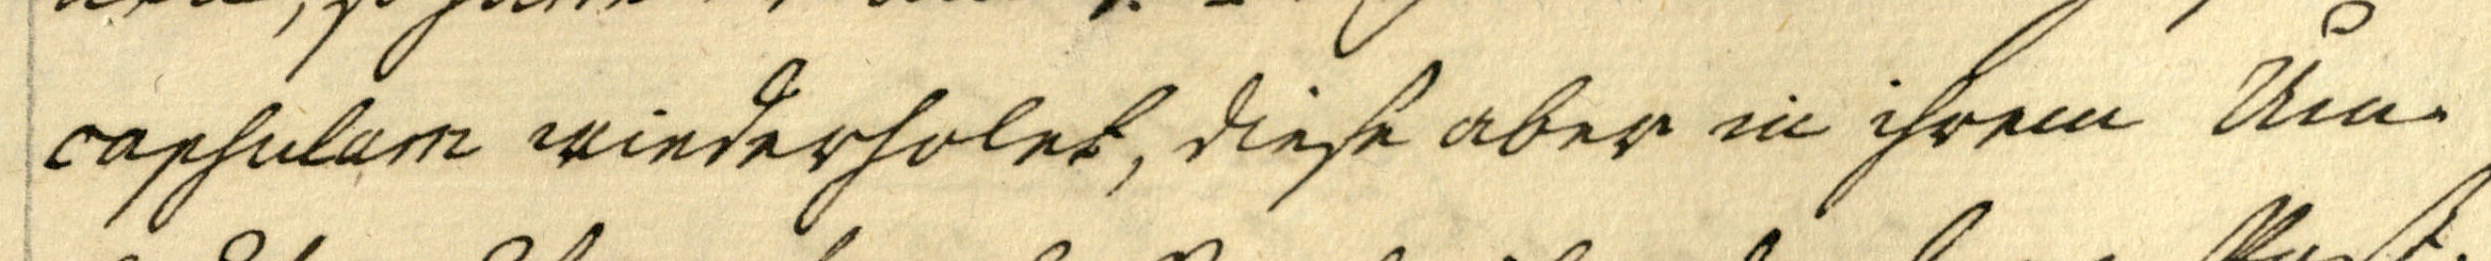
Capsulam wiederholt, diese aber in ihren Um¬
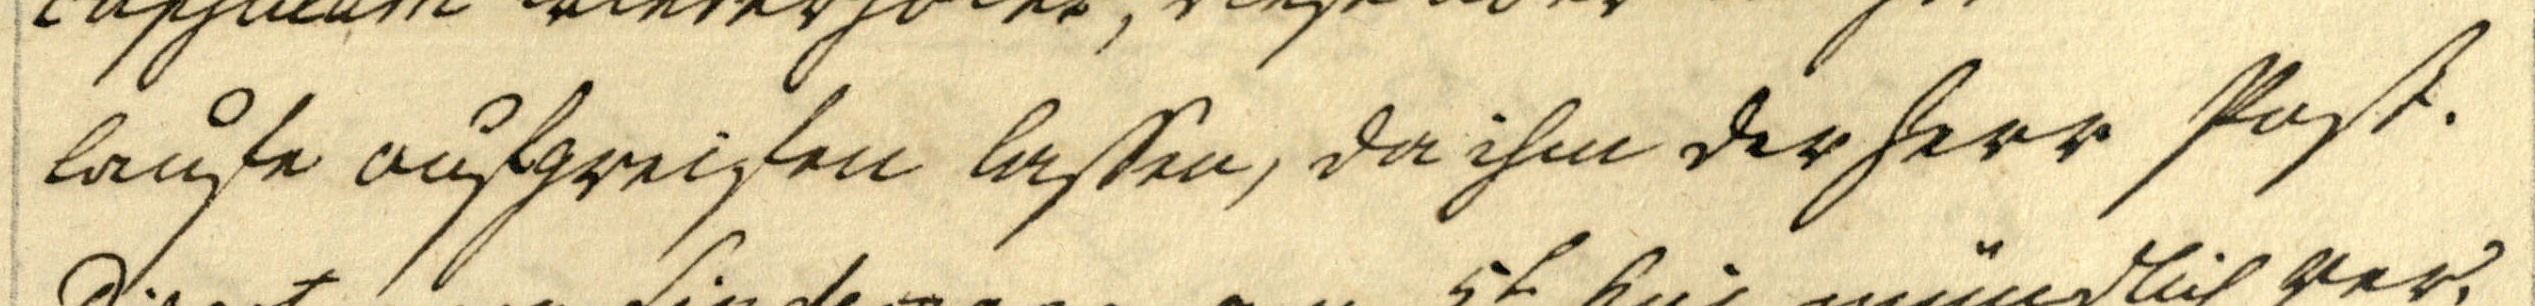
laufe aufgreifen lassen, da ihm der Herr Post¬
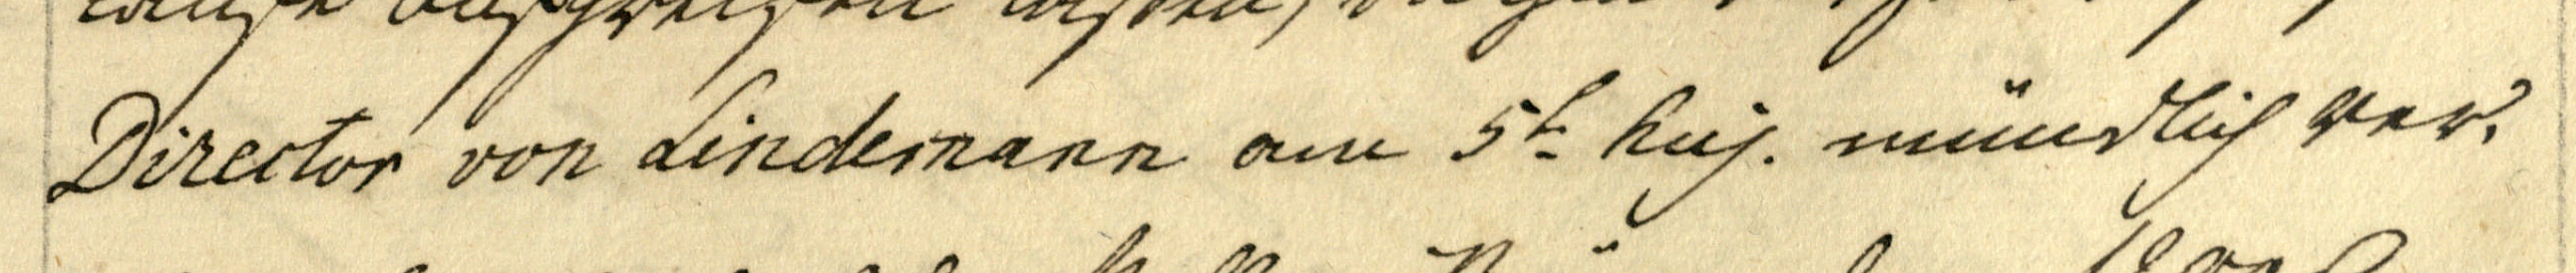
Director von Lindemann am 5. t. huj. mündlich ver¬
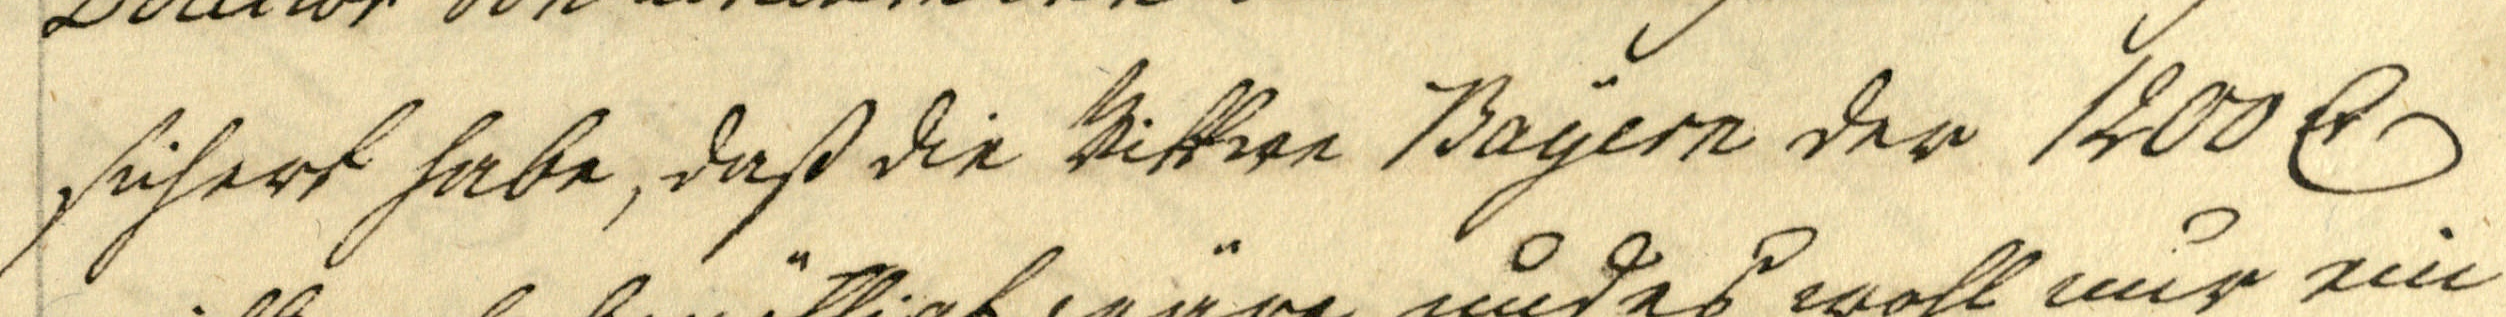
sichert habe, daß die Wittwe Baÿern der 1200 l.
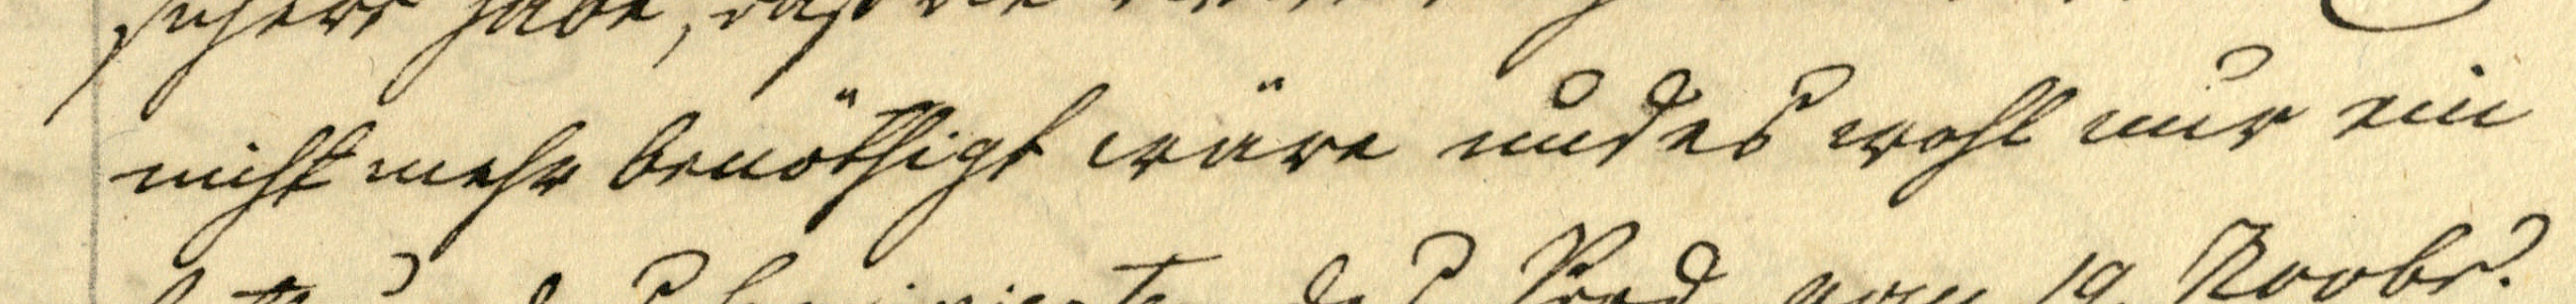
nicht mehr benöthigt wäre und es wohl nur ein
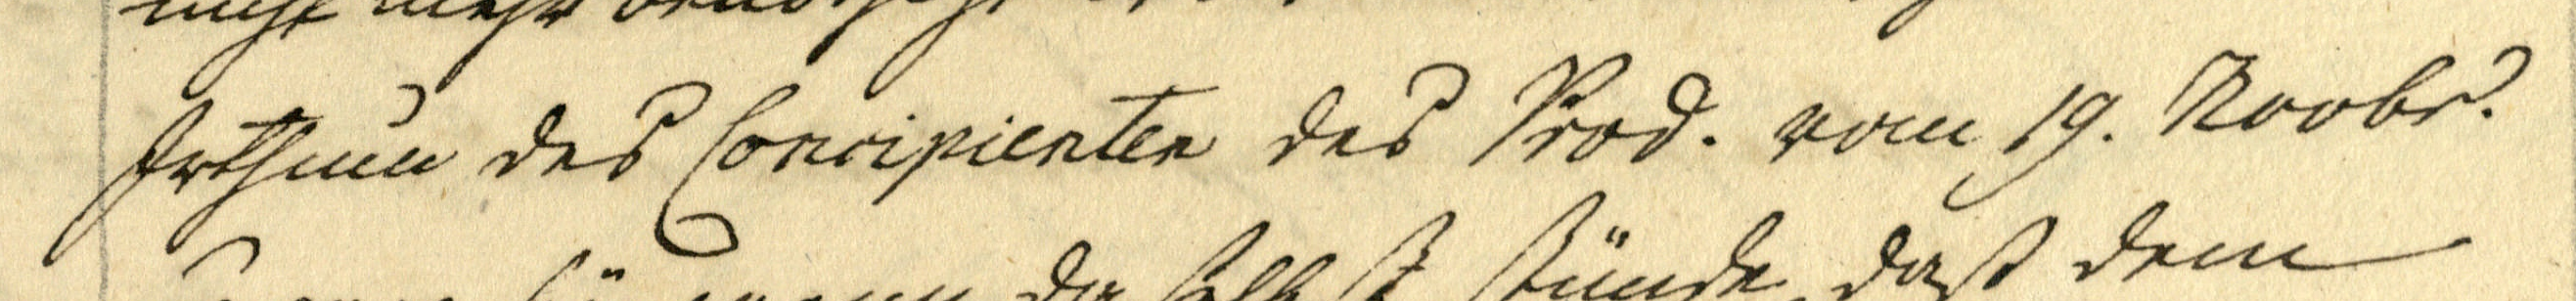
Irthum des Concipienten des Prod. vom 19. Novbr.
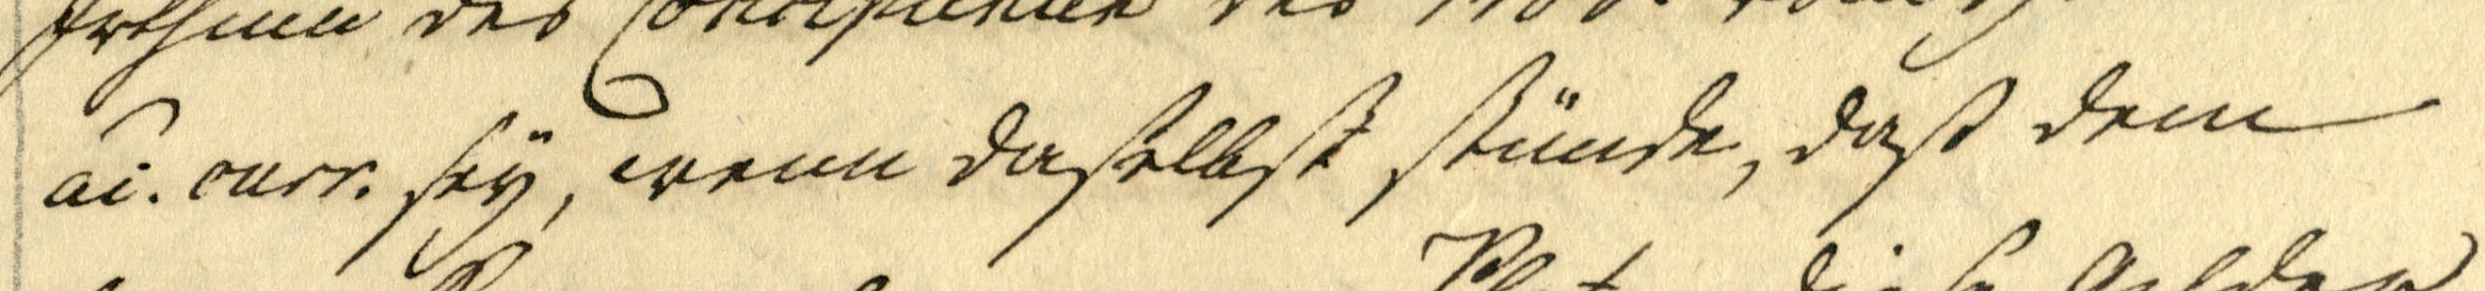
ai. curr. seÿ, wenn daselbst stünde, daß dem
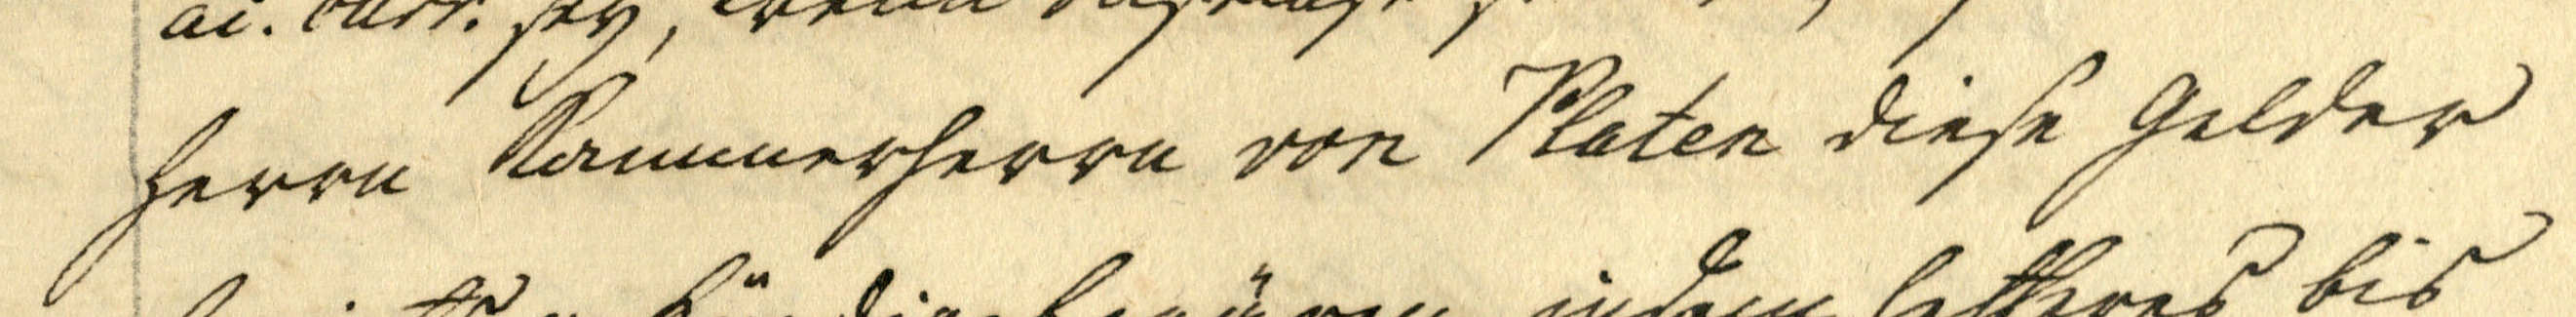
Herrn Kammerherrn von Platen diese Gelder
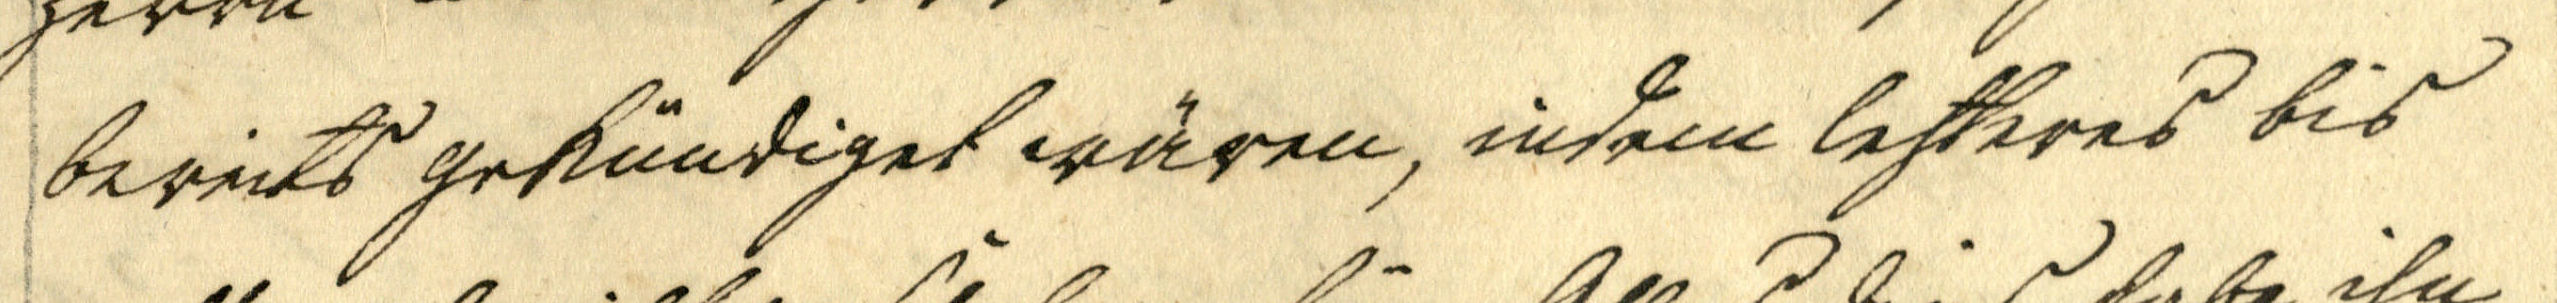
bereits gekündiget wären, indem letzteres bis
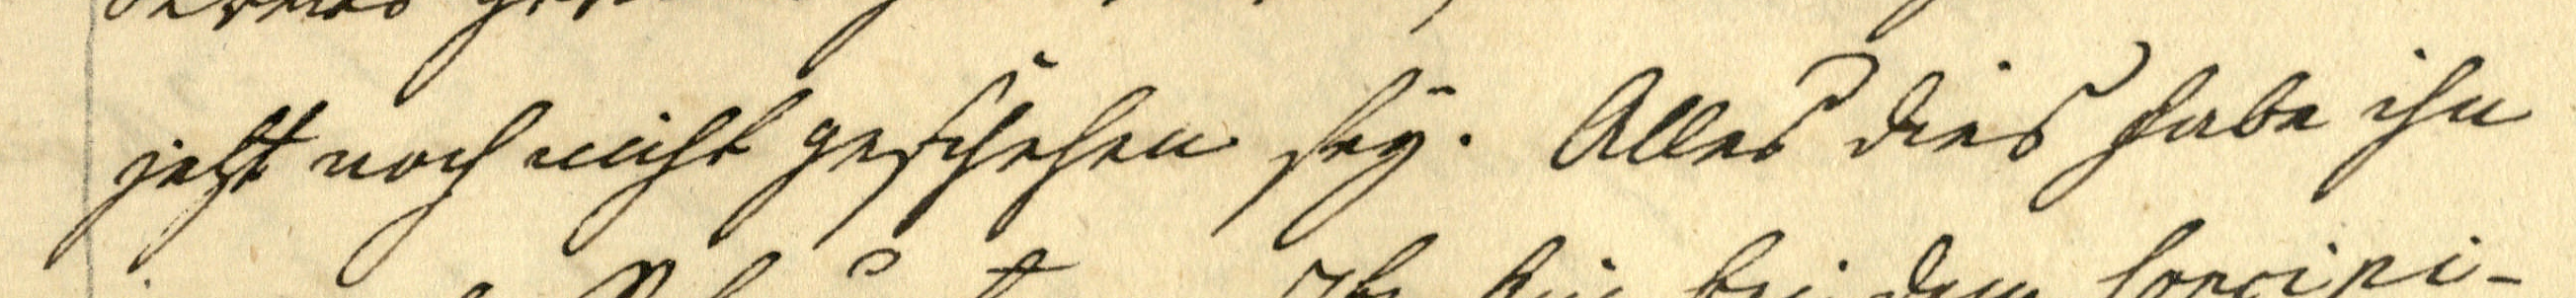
jetzt noch nicht geschehen seÿ. Alles dies habe ihn
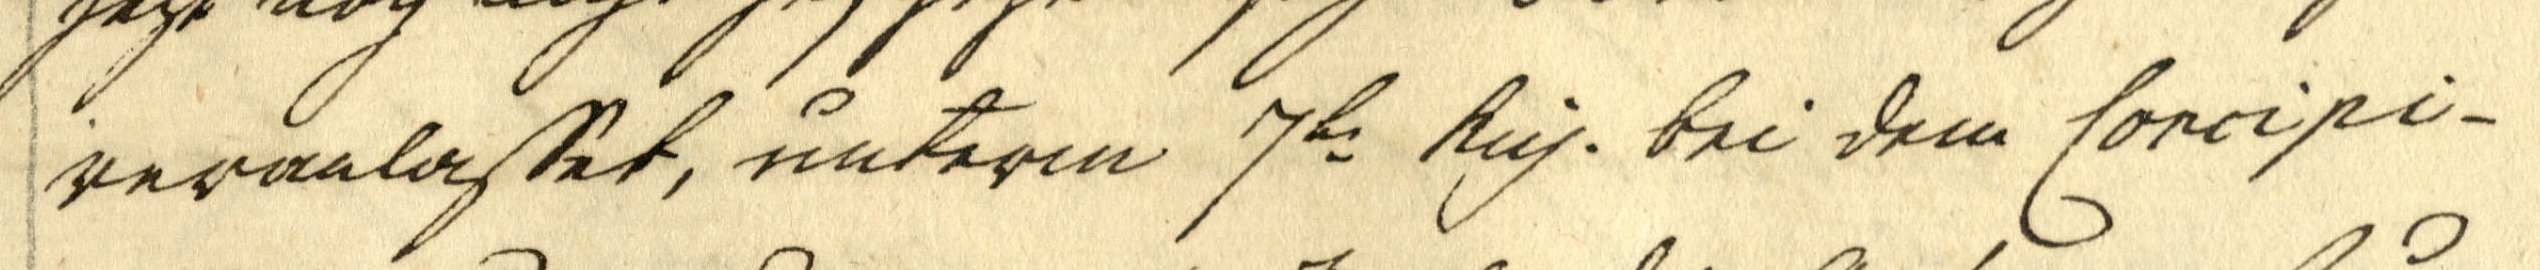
veranlasset, unterm 7 ten huj. bei dem Concipi¬
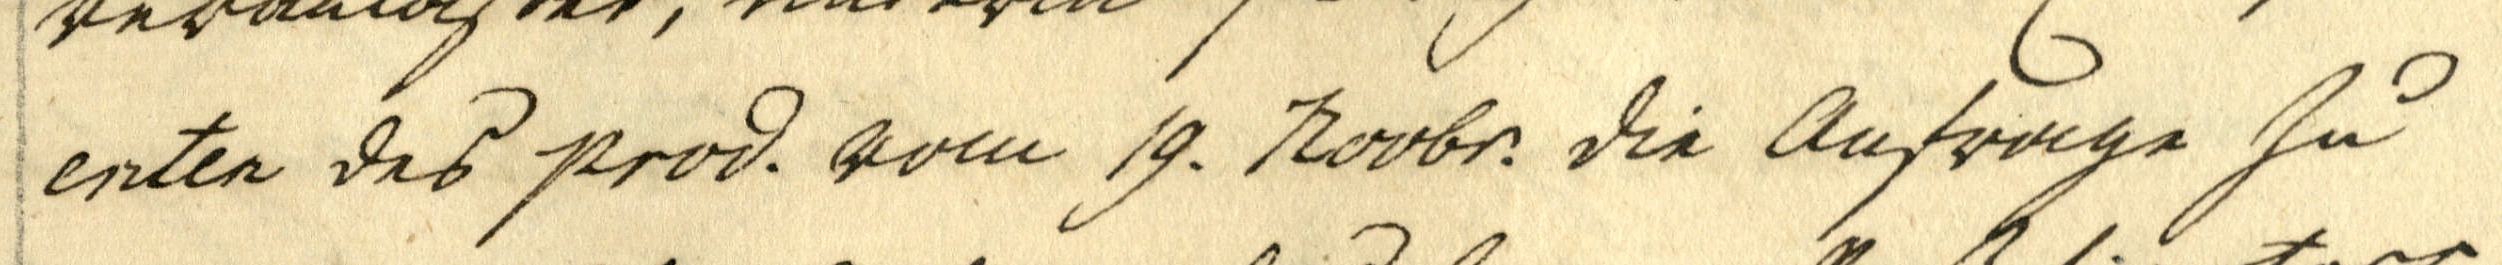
enten des prod. vom 19. Novbr. die Anfrage zu
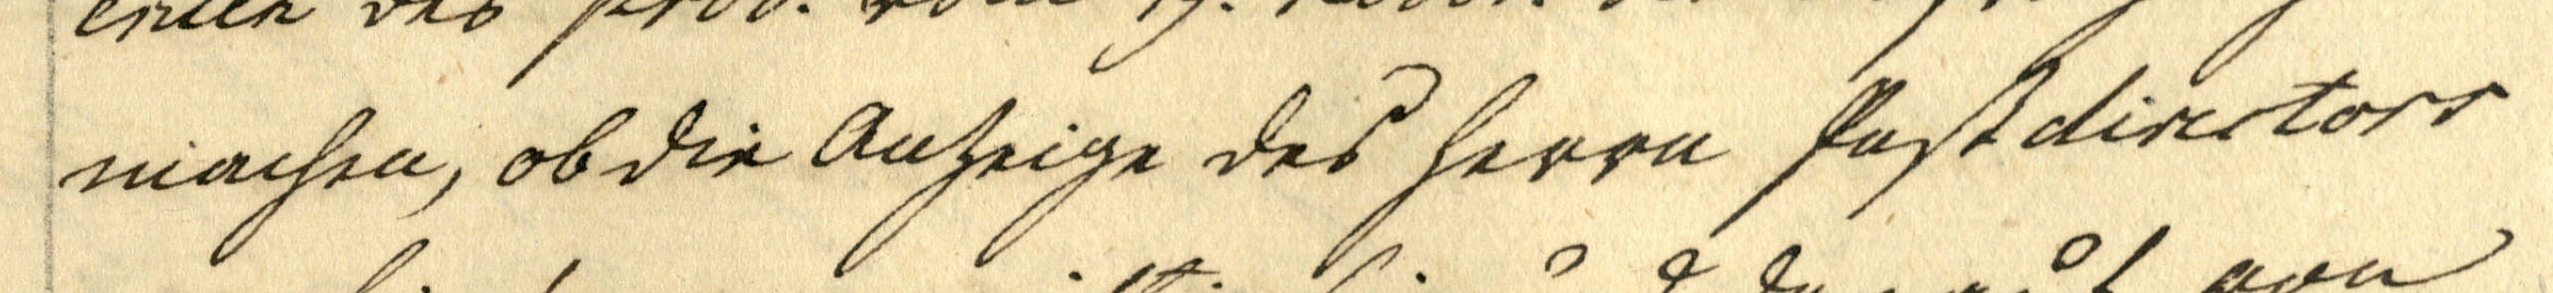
machen, ob die Anzeige des Herrn Postdirectors
